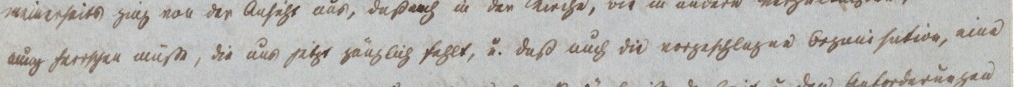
nung herrschen müsse, die uns jetzt gänzlich fehlt, u. daß auch die vorgeschlagne Organisation, eine
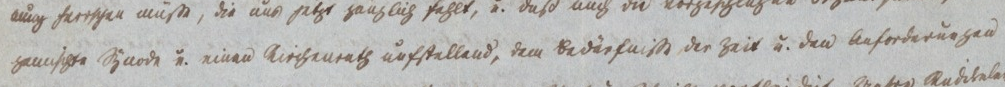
gemischte Synode u. einen Kirchenrath aufstellend, dem Bedürfnisse der Zeit u. den Anforderungen
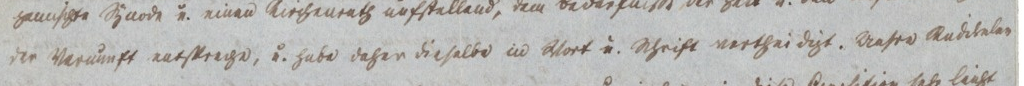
der Vernunft entspreche, u. habe daher dieselbe in Wort u. Schrift vertheidigt. Unsre Radikalen
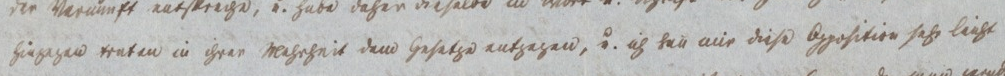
hingegen traten in ihrer Mehrheit dem Gesetze entgegen, u. ich kann mir diese Opposition sehr leicht
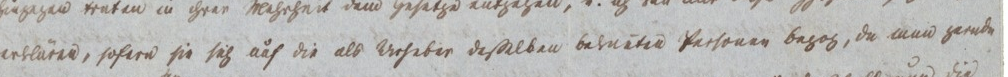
erklären, sofern sie sich auf die als Urheber desselben bekannten Personen bezog, da man gerade
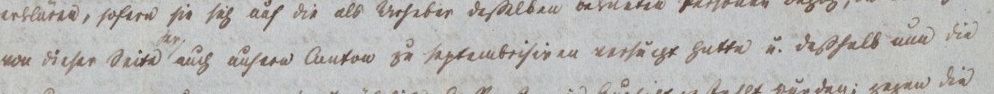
von dieser Seite her auch unsern Canton zu septembrisiren versucht hatte u. deßhalb nun die
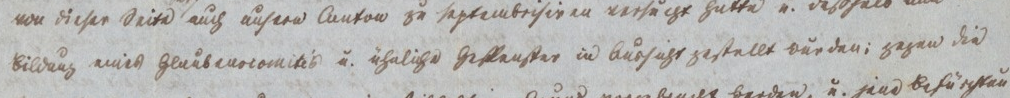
Bildung eines Glaubens comité's u. ähnliche Gespenster in Aussicht gestellt wurden; gegen die
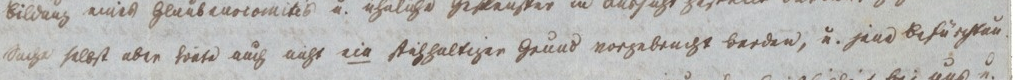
Sache selbst aber konnte auch nicht ein stichhaltiger Grund vorgebracht werden, u. jene Befürchtun-
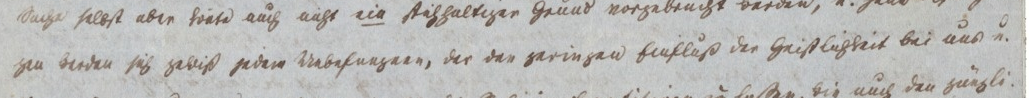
gen werden sich gewiß jedem Unbefangnen, der den geringen Einfluß der Geistlichkeit bei uns u.
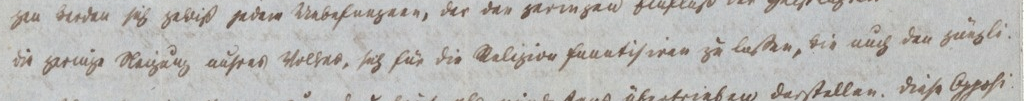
die geringe Neigung unsres Volkes, sich für die Religion fanatisiren zu lassen, wie auch den gänzli-
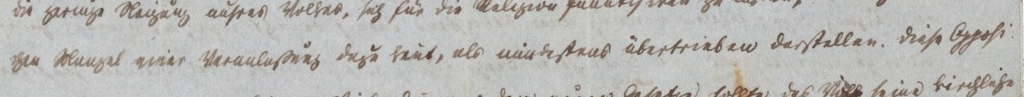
chen Mangel einer Veranlassung dazu kennt, als mindestens übertrieben darstellen. Diese Opposi-
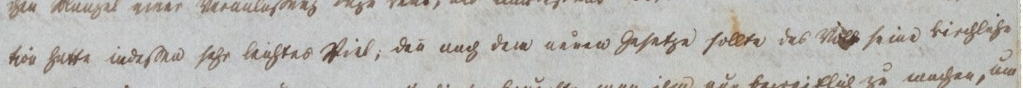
tion hatte indessen sehr leichtes Spiel; denn nach dem neuen Gesetze sollte das Volk seine kirchliche
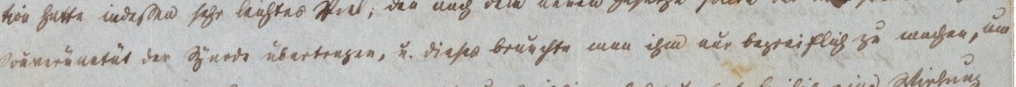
Souveränetät der Synode übertragen, u. dieses brauchte man ihm nur begreiflich zu machen, um
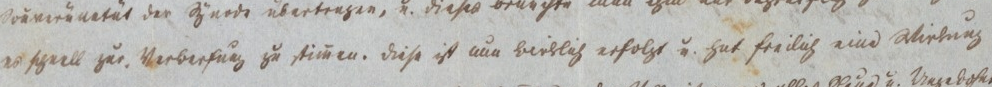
es schnell zur Verwerfung zu stimmen. Diese ist nun wirklich erfolgt u. hat freilich eine Wirkung
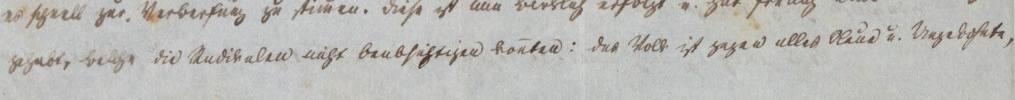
gehabt, welche die Radikalen nicht beabsichtigen konnten: das Volk ist gegen alles Neue u. Ungewohnte,
